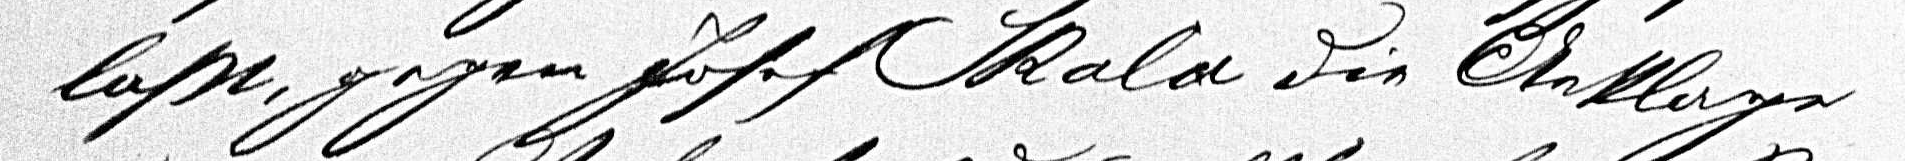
laßt, gegen Josef Skala die Anklage
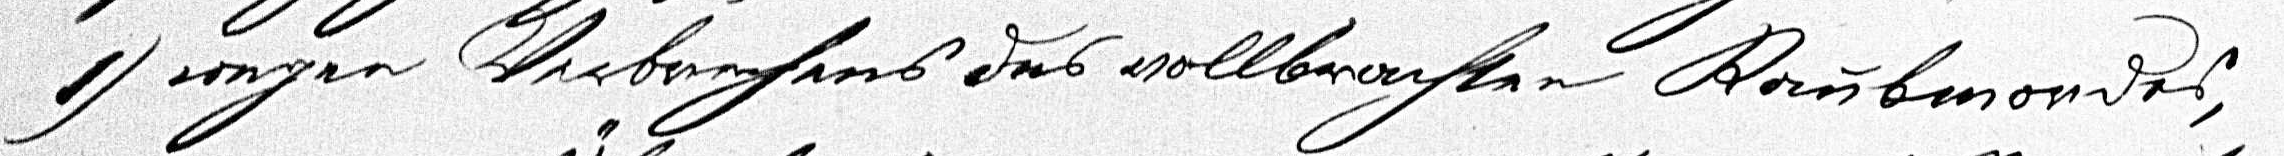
1) wegen Verbrechens des vollbrachten Raubmordes,
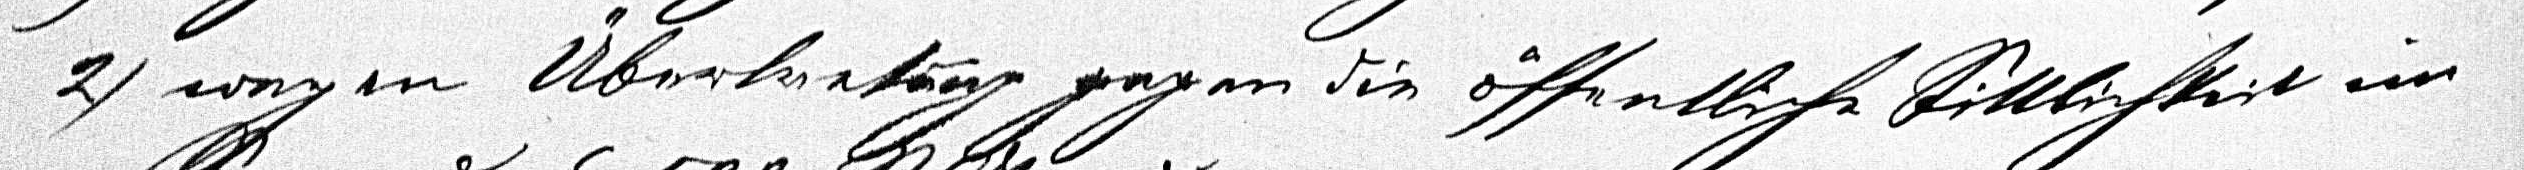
2) wegen Übertretung gegen die öffentliche Sittlichkeit im
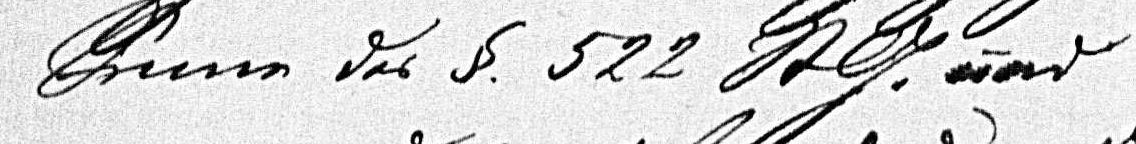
Sinne des §522 StG und
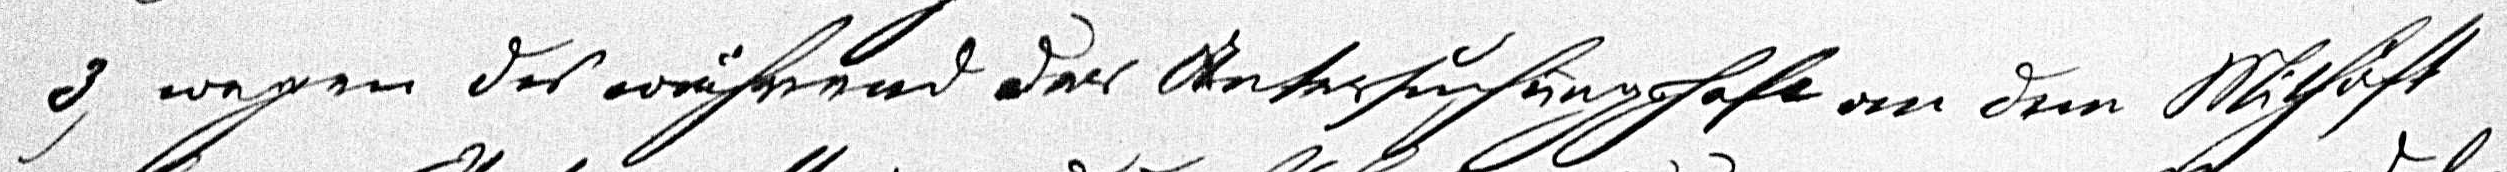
3) wegen des während der Untersuchungshaft an dem Mithaft¬
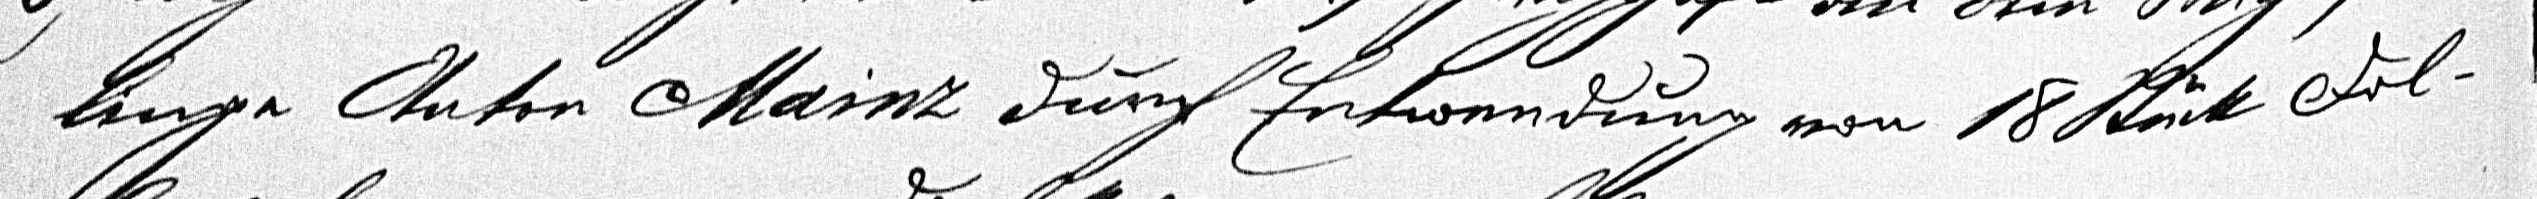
linge Anton Mainz durch Entwendung vom 18 Stück Dol¬
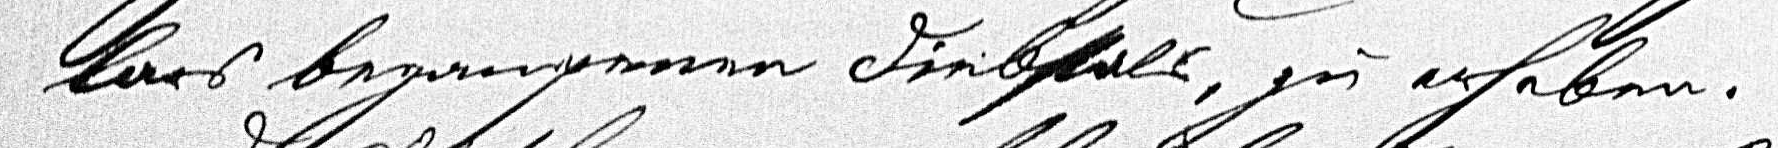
lars begangenen Deibstals, zu erheben.
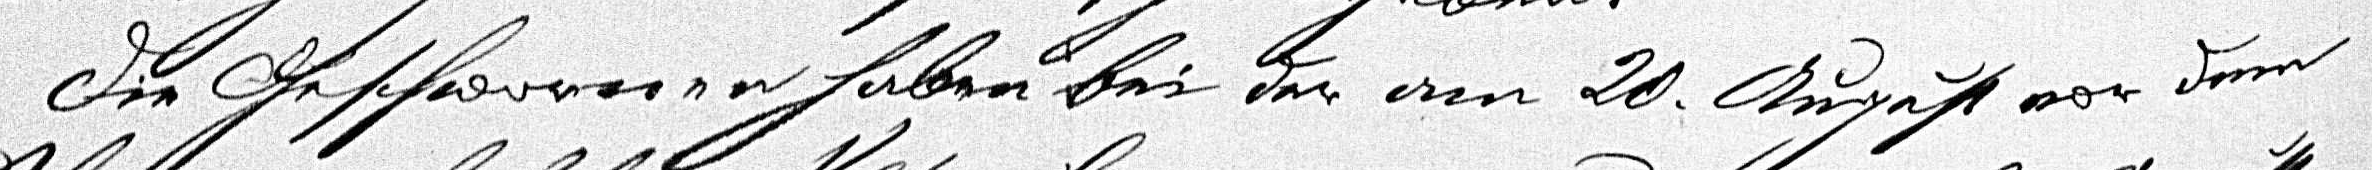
Die Geschorenen haben bei der am 20. August vor dem
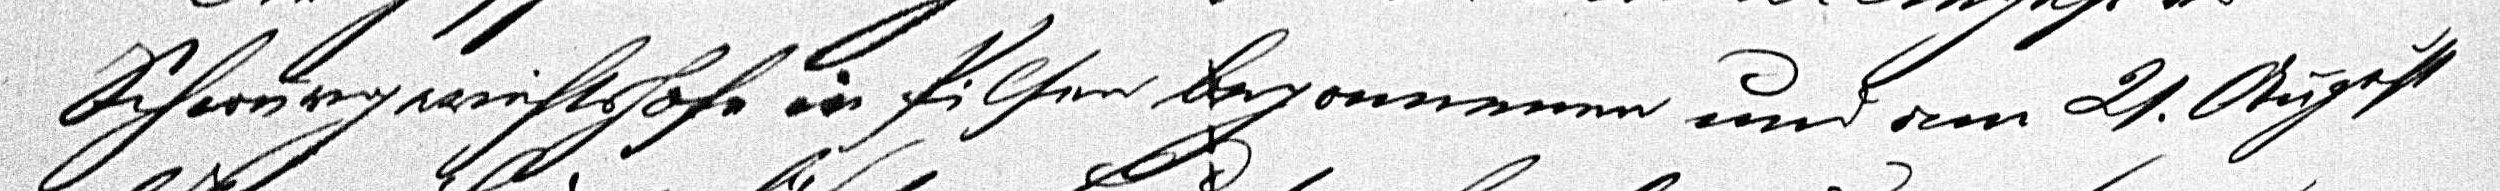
Schwurgerichtshof in Pilsen begonnenen und am 21. August
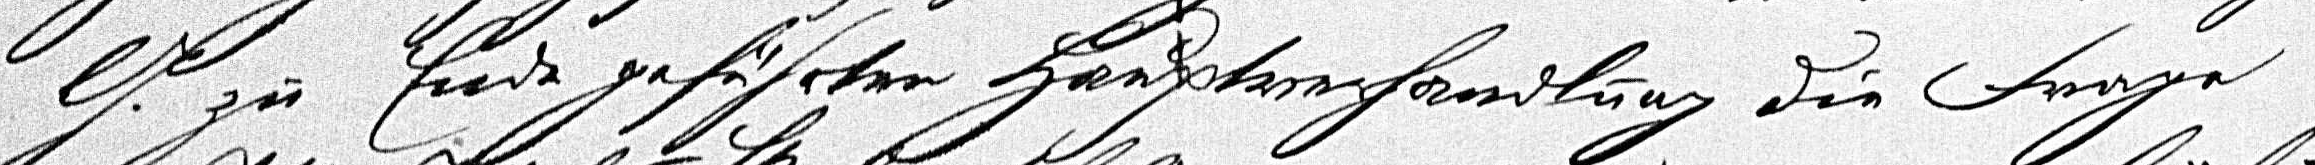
lJ. zu Ende geführten Hauptverhandlung die Frage
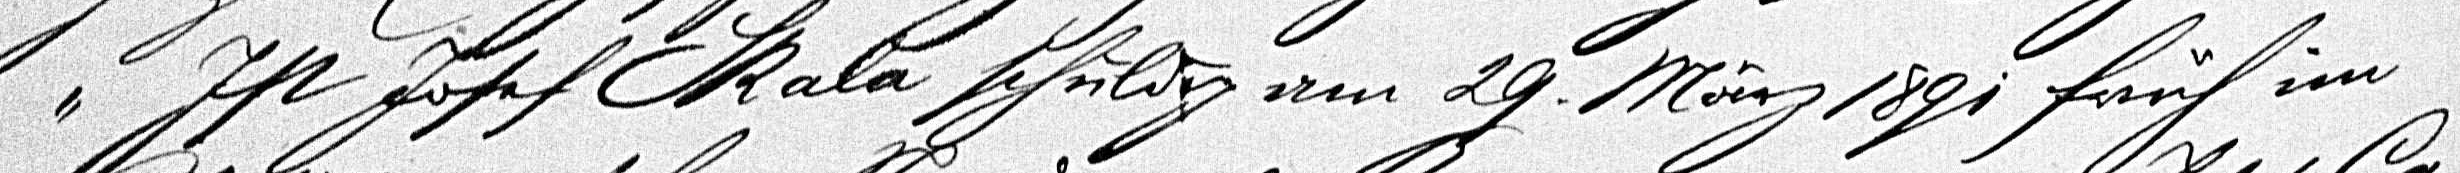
„Ist Josef Skala schuldig am 29. März 1891 früh im
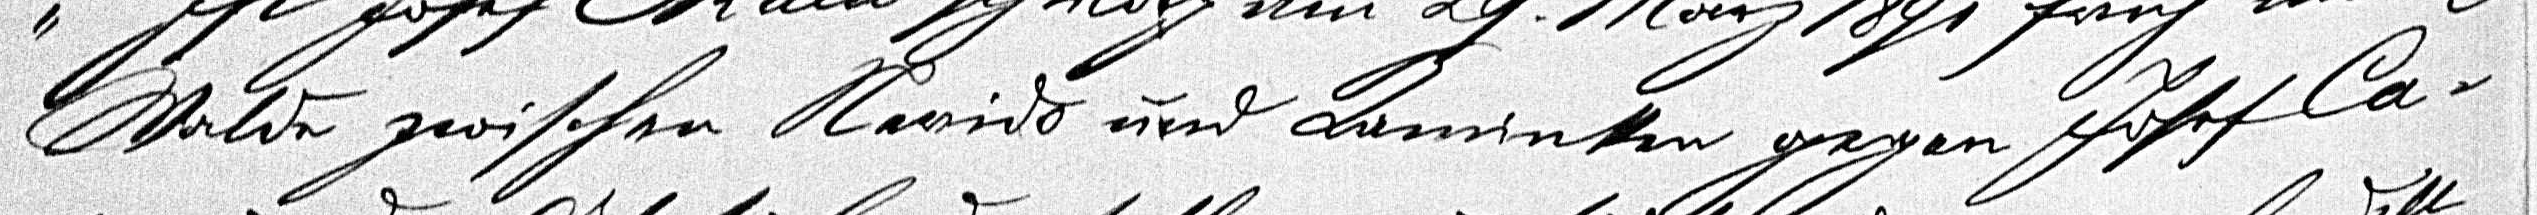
Walde zwischen Nevido und Kaminken gegen Josef Ča¬
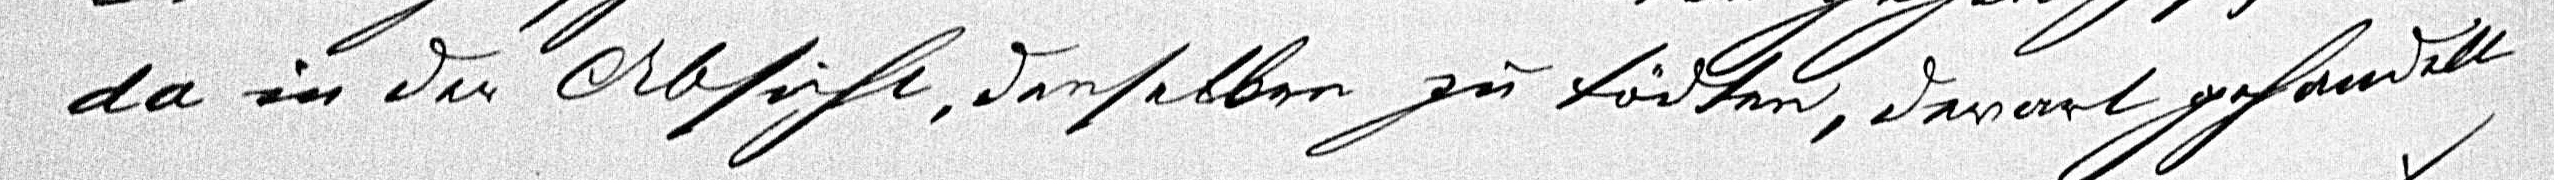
da in der Absicht, denselben zu tödten, derart gehandelt
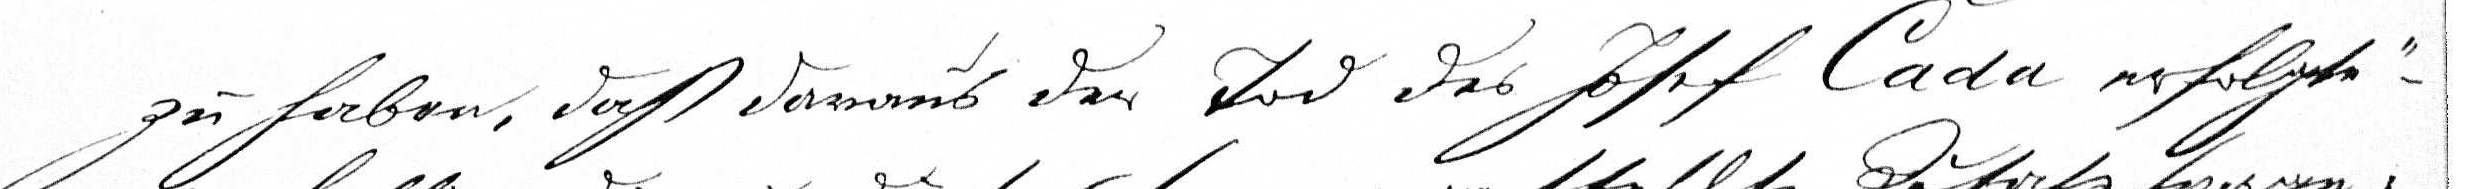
zu haben, daß daraus der Tod des Josef Čada erfolgte“ –
